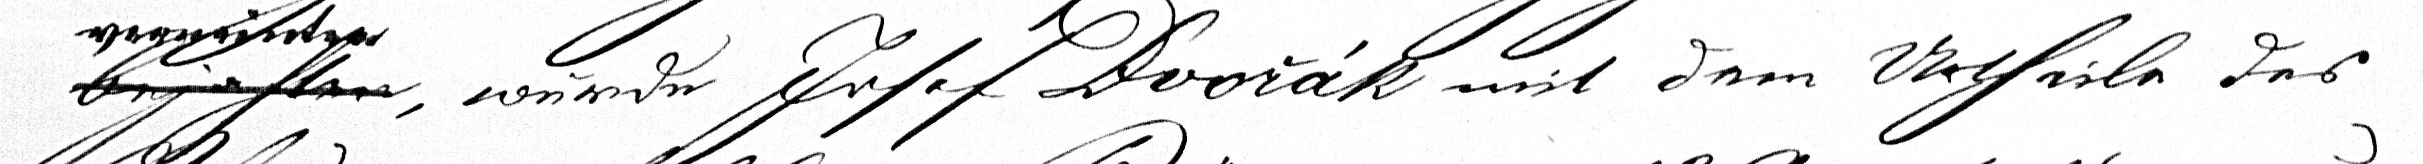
wurde Josef Dvořák mit dem Urtheile des
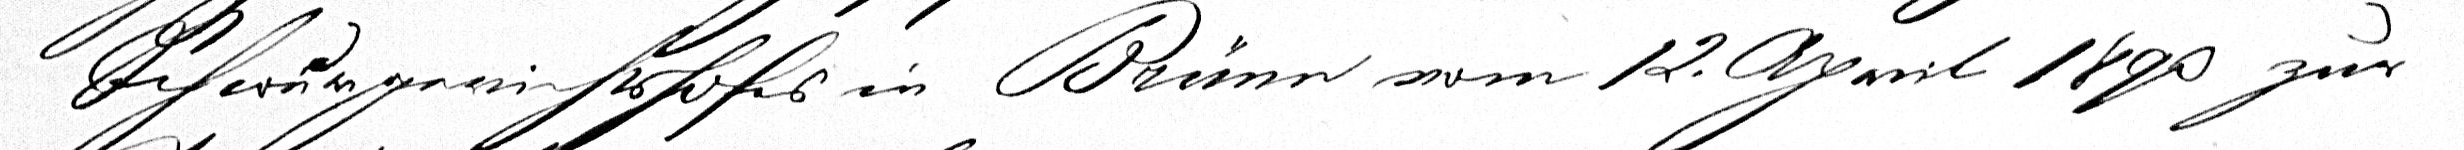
Schwurgerichtshofes in Brünn vom 12. April 1890 zur
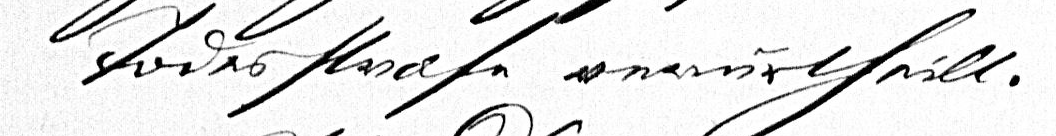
Todesstrafe verurtheilt.
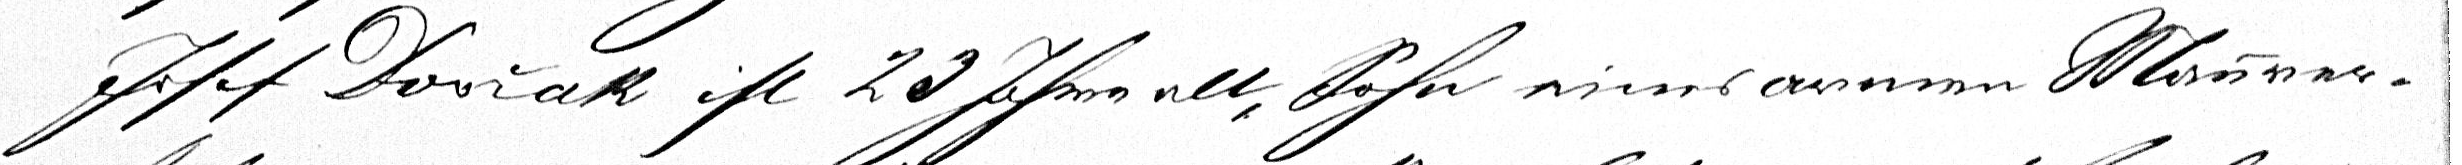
Josef Dvořak ist 23 Jahre alt, Sohn eines armen Maurer¬
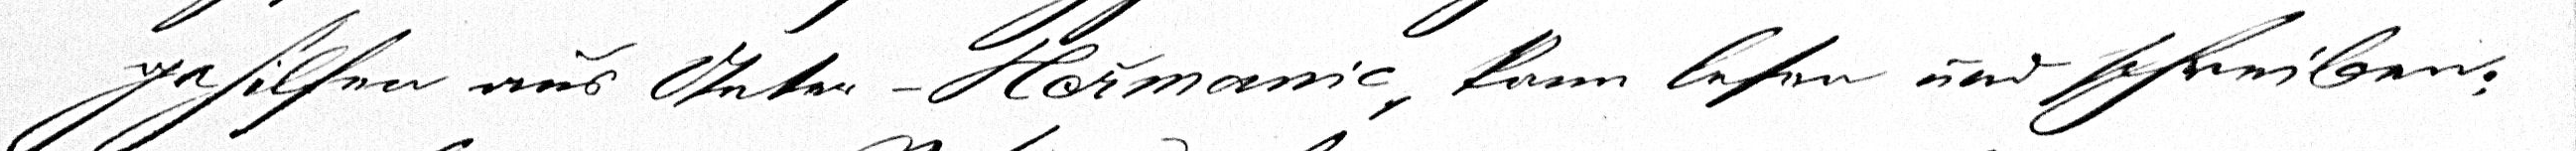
gehilfen aus Unter - Hořmanic, kann lesen und schreiben:
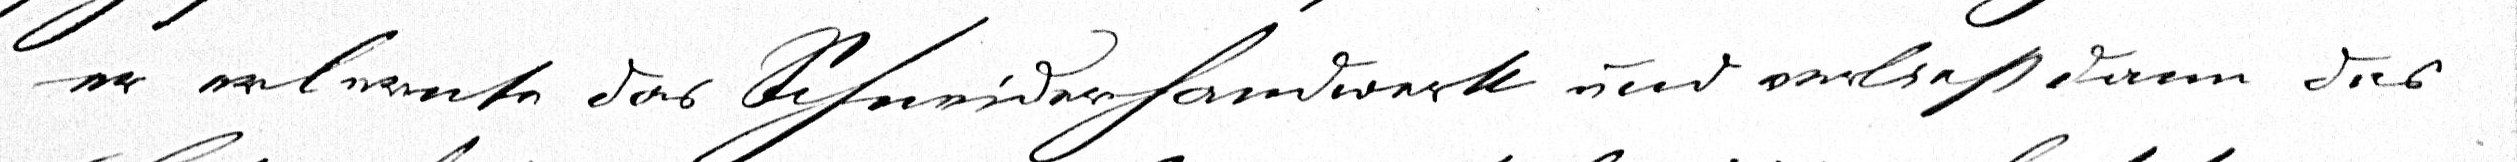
er erlernte das Schneiderhandwerk und verließ dann des
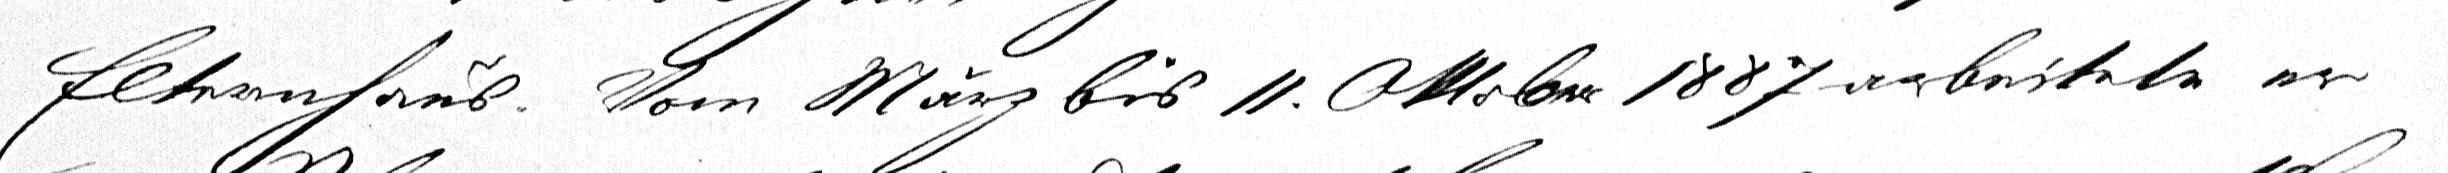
Elternhaus. Vom März bis 11. Oktober 1887 arbeitete er
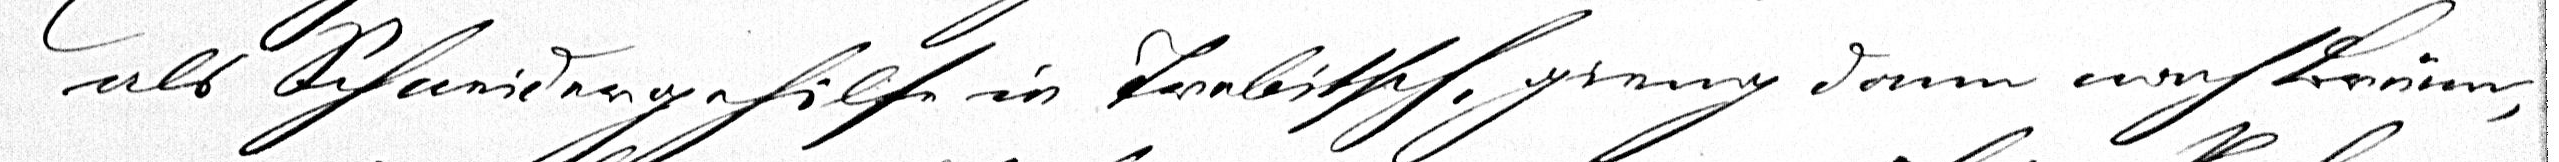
als Schneidergehilfe in Trebitsch, gieng dann nach Brünn,
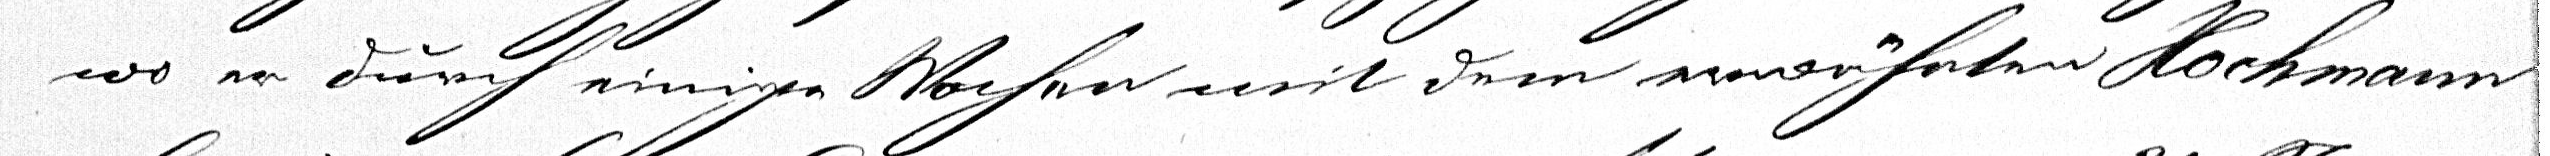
wo er durch einige Wochen mit dem erwähnten Hochmann
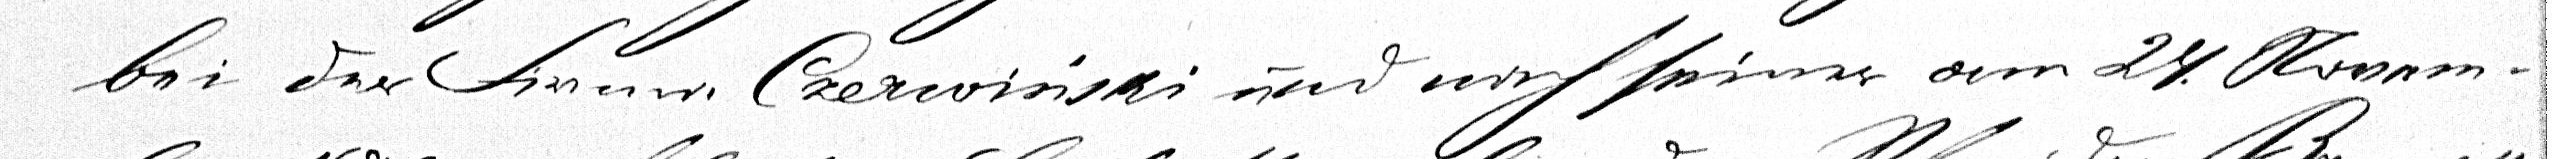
bei der Firne. Czerwinski und noch seiner am 24. Novem¬
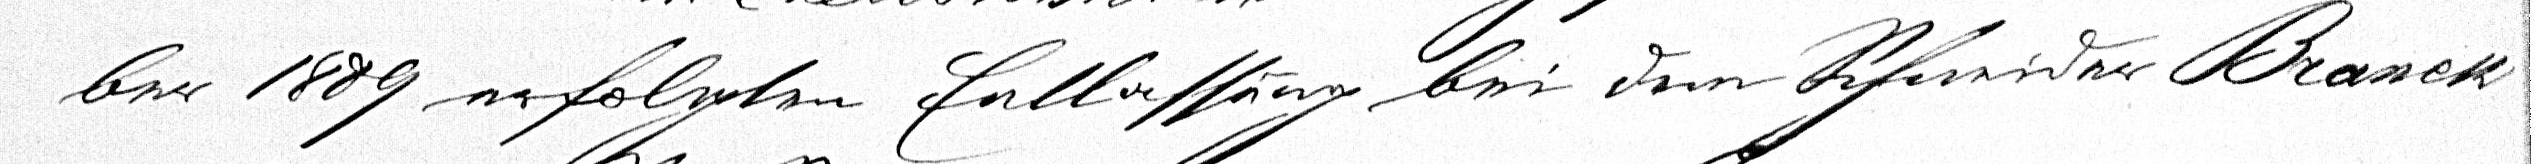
ber 1889 erfolgten Entlassung bei den Schneider Branek
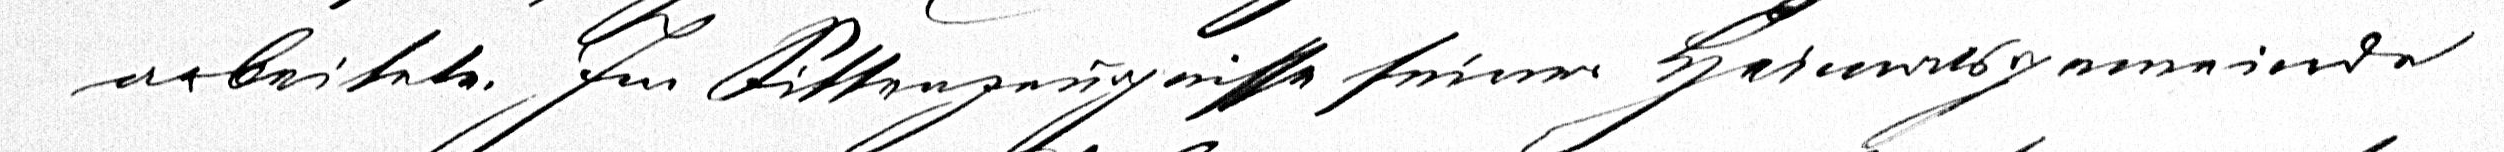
arbeitete. Im Sittenzeugnisse seiner Heimalsgemeinde
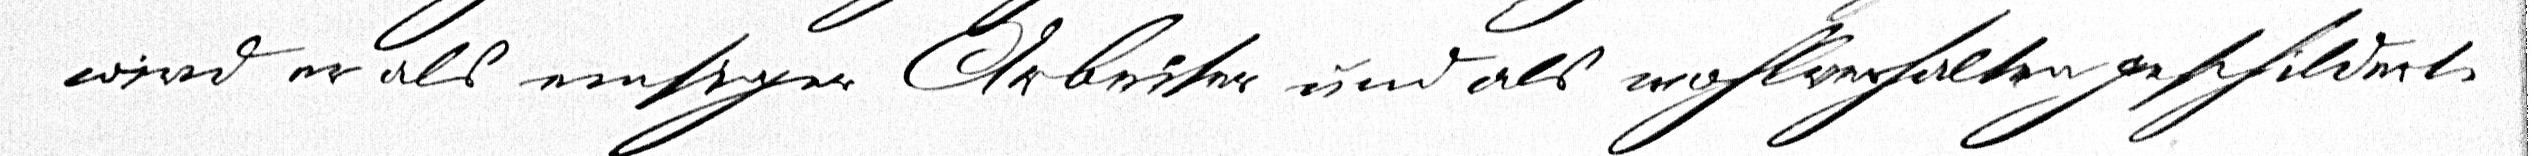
wird er als emsiger Arbeiter und als wohlverhalten geschildert
